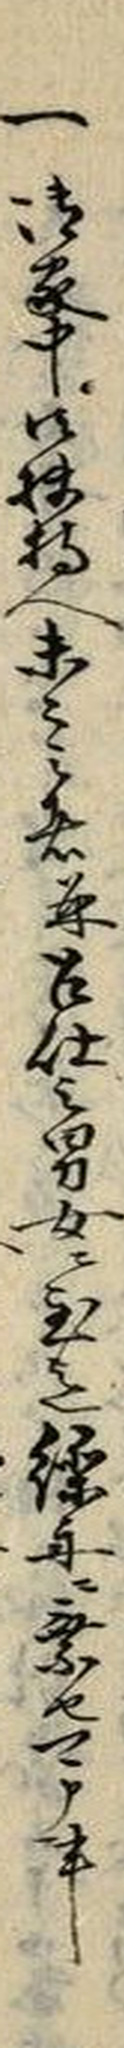一御家中御扶持人末々之者并召仕之男女に至迄繰舟に乗セ可申事
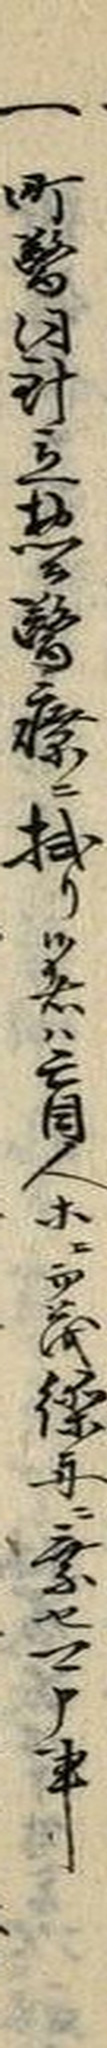一町医同針立惣て医療に掛り候者は盲人等にても繰舟に乗セ可申事
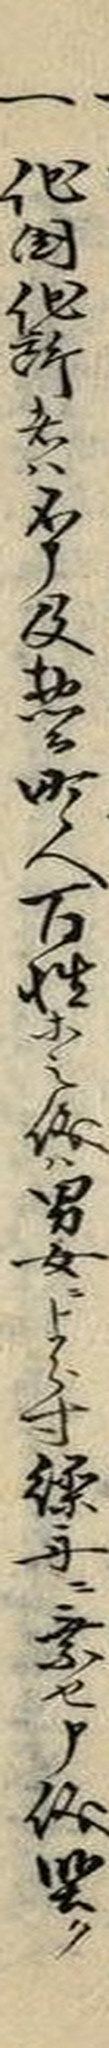一他国他所者は不申及惣て町人百姓等之儀は男女によらす繰舟に乗セ申儀堅ク
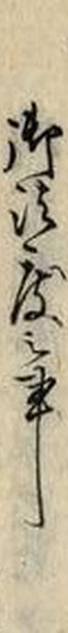御法度之事
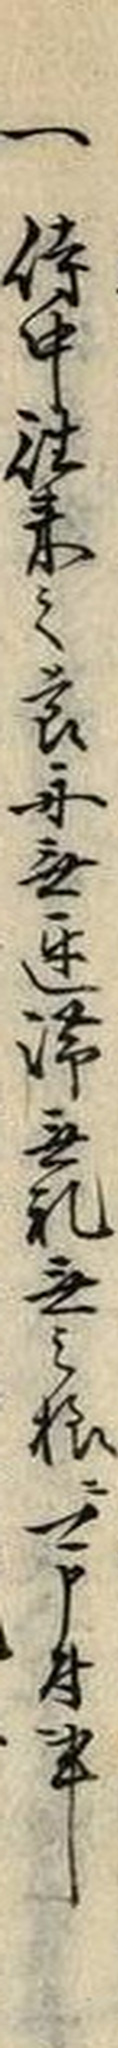一侍中往来之節舟無遅滞無礼無之様に可申付事
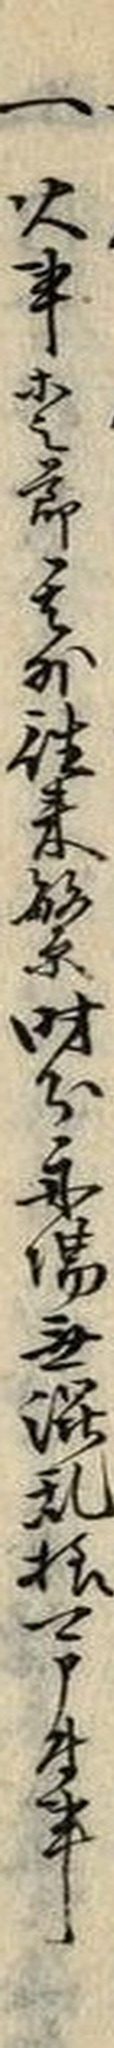一火事等之節其外往来繁時分舟場無混乱様可申付事
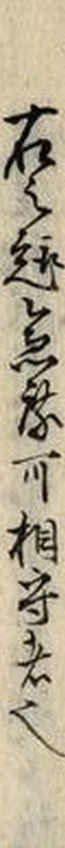右之趣急度可相守者也
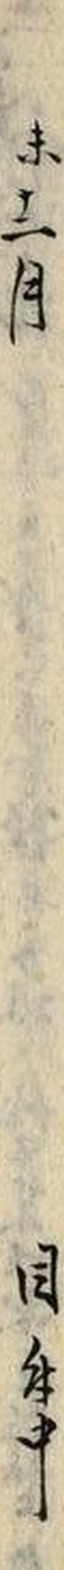未十二月目付中
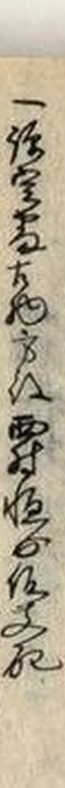一評定番古物方役西村恒右衛門仮支配
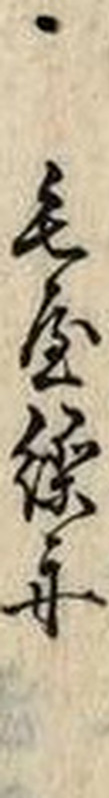毛屋繰舟
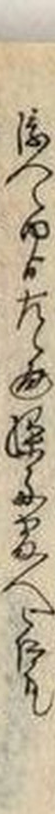添人之内ゟ左之通繰舟番人被仰付候
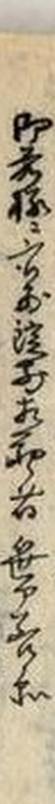御前様に最前錠前相勤候者笹部善兵衛
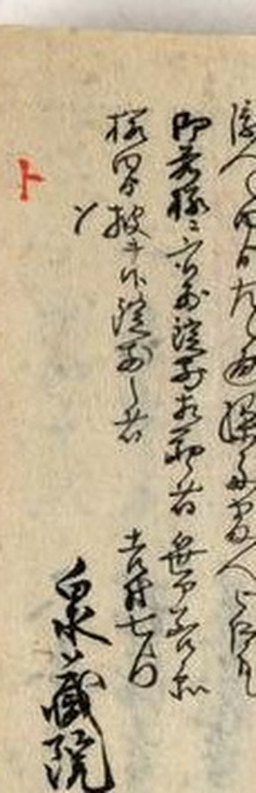桜田ゟ披キ候錠前之者吉村七右衛門
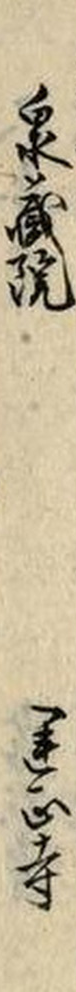泉蔵院運正寺

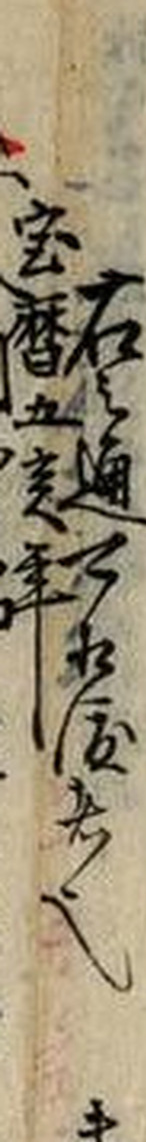宝暦五亥年
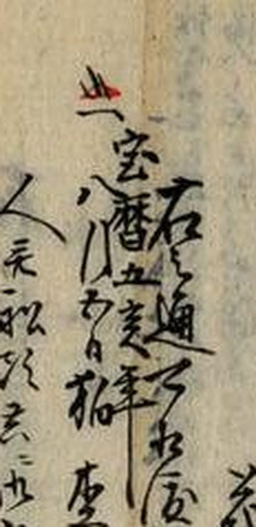宝暦五亥年
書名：御城下諸事之部
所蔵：福井県文書館 Fukui Prefectural Archives
